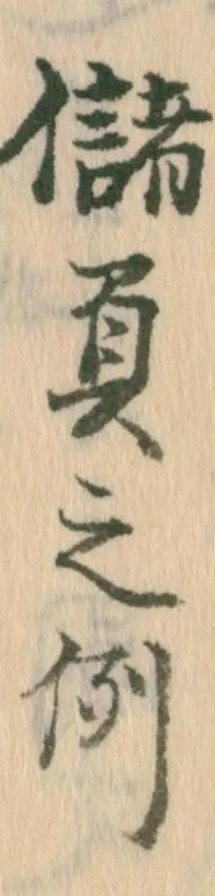儲負之例
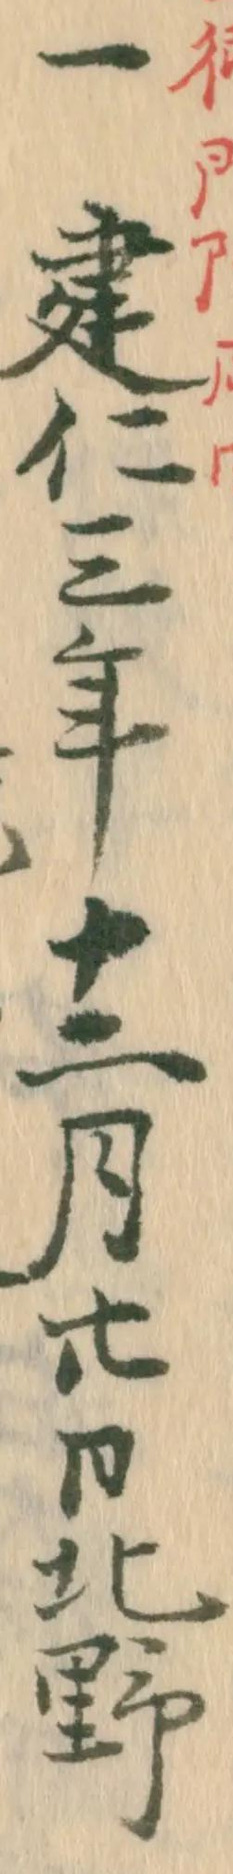一建仁三年十二月廿日北野
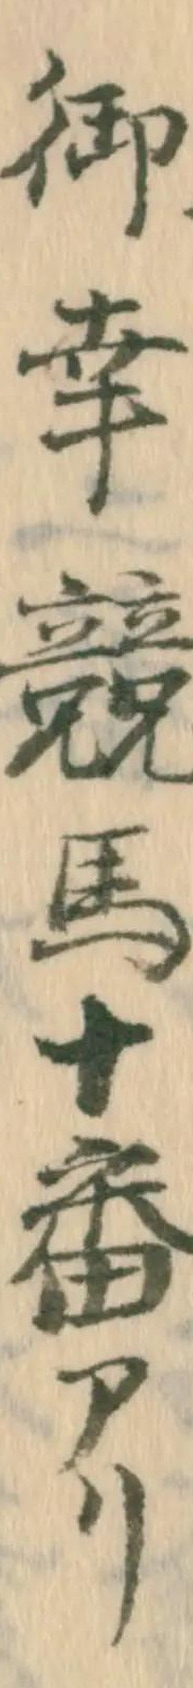御幸競馬十番アリ
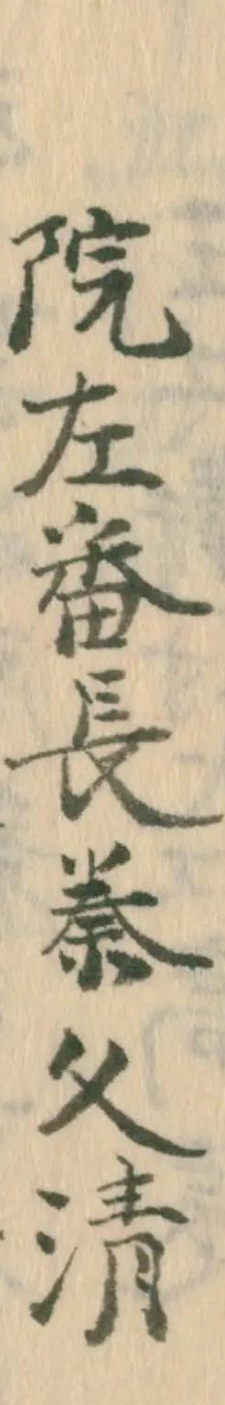左院左番長秦久清
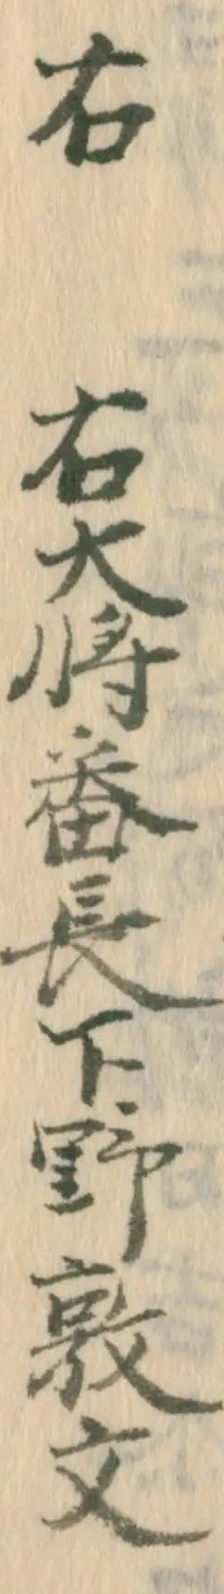右右大将番長下野敦文
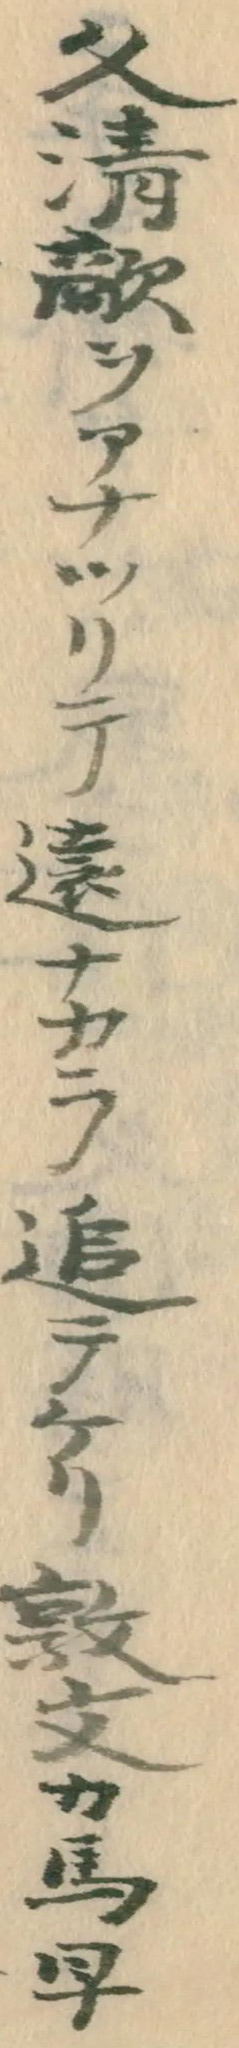久清敵をアナツリテ遠ナカラ追テケリ敦文カ馬早
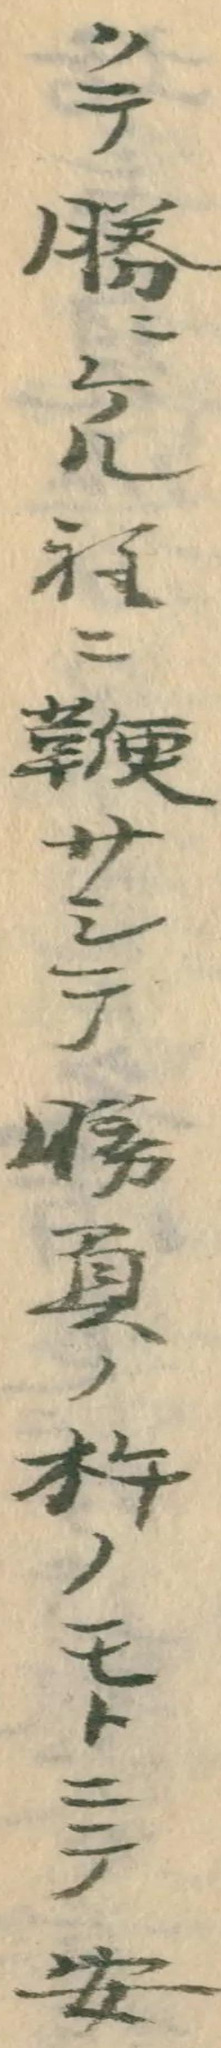クテ勝ニケル程ニ鞭サシテ勝負ノ杵ノモトニテ安

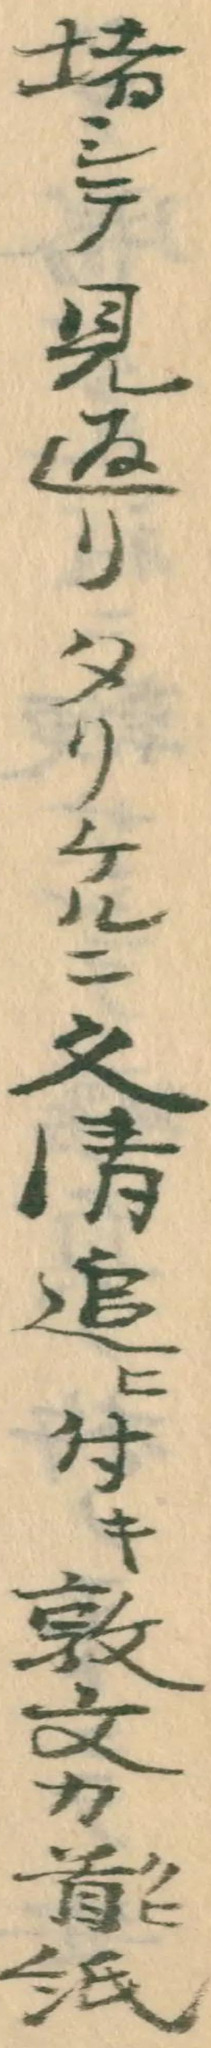堵シテ見返リタリケルニ久清追ヒ付キ敦文カ首紙
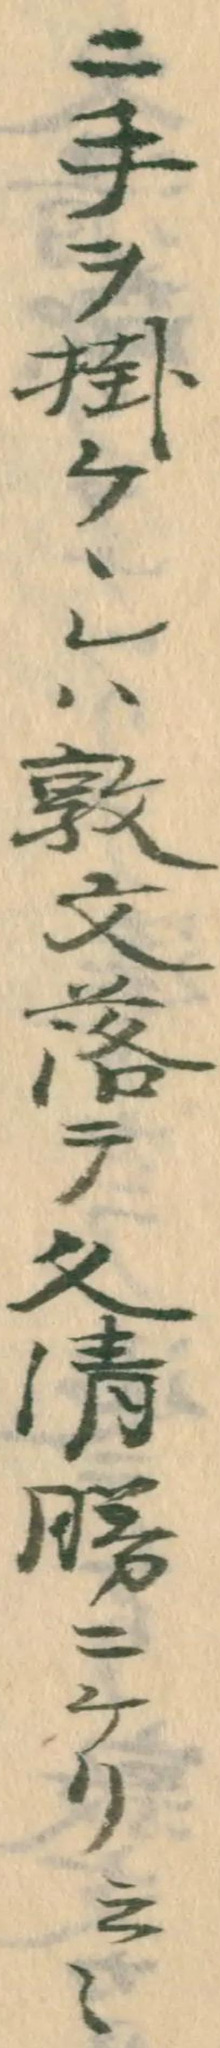二手ヲ掛ケヽレハ敦文落テ久清勝ニケリ云々
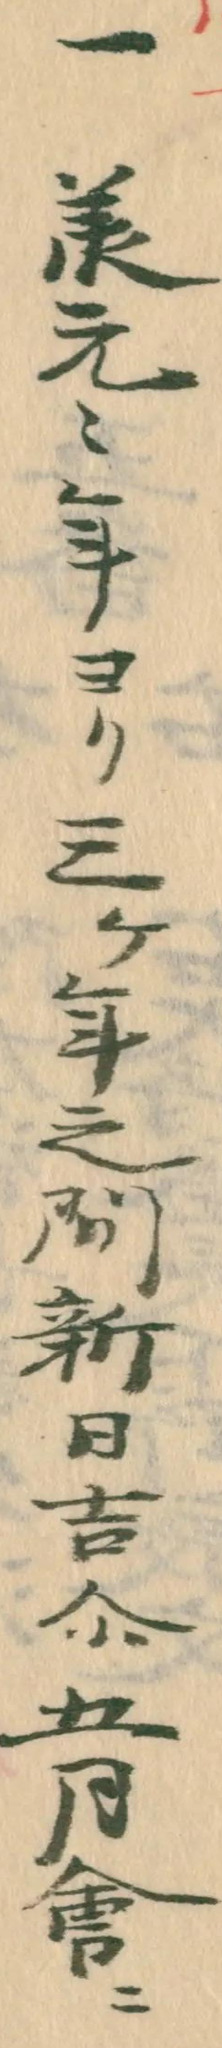一承元々年ヨリ三ヶ年之間新日吉爾五月会ニ
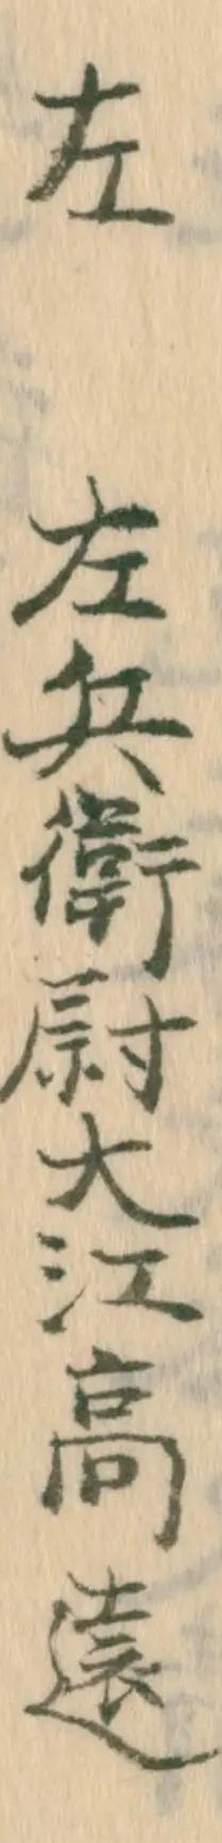左左兵衛尉大江高遠
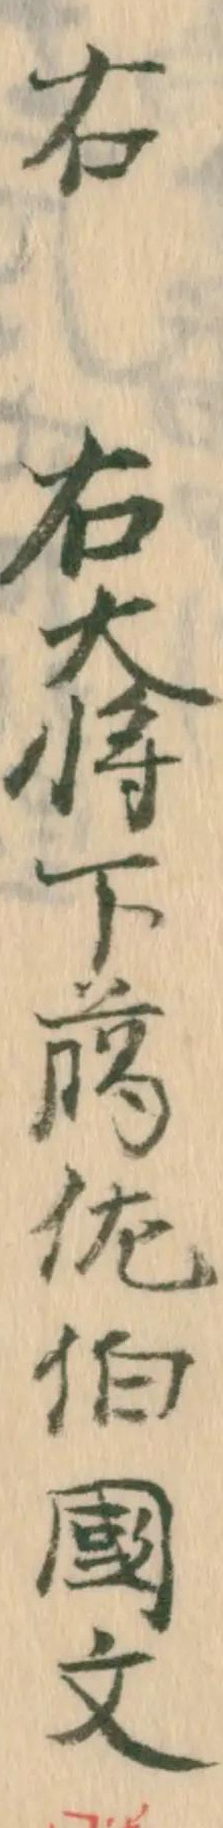右右大将下臈佐伯国文
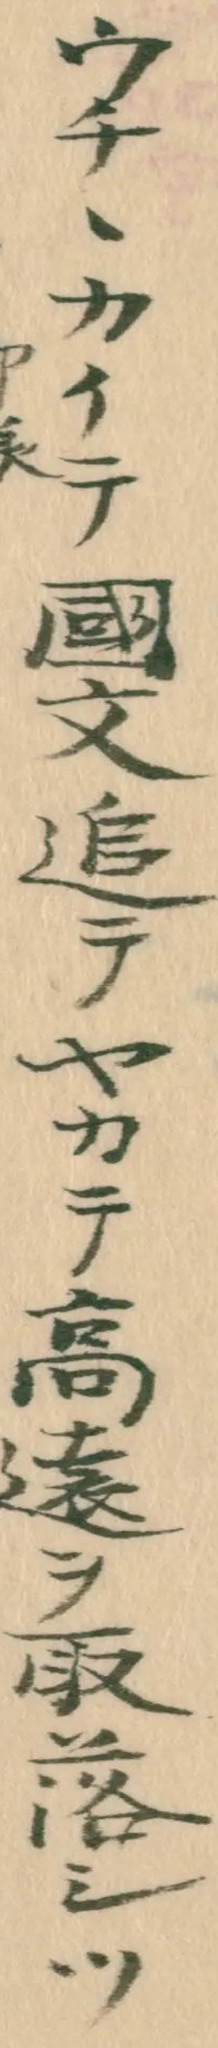ウチヽカイテ国文追テヤカテ高遠ヲ取落シツ
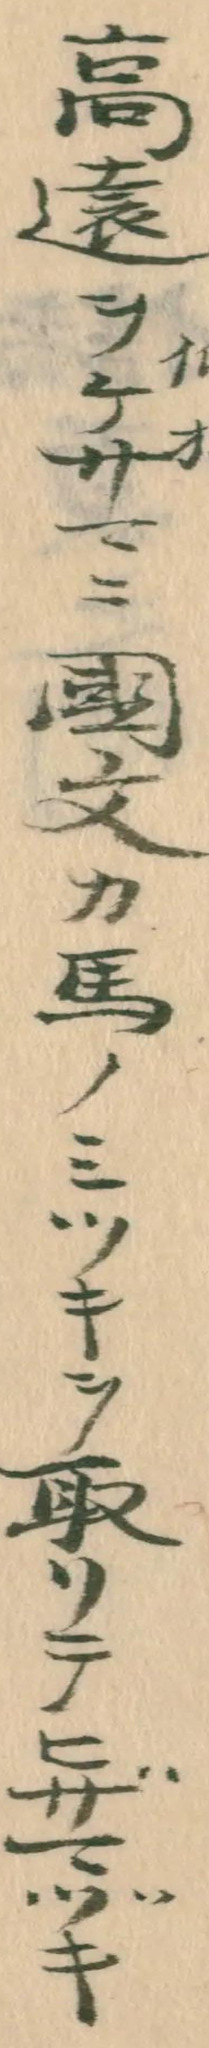高遠ヲケサマニ国文カ馬ノミツキヲ取リテヒザマヅキ
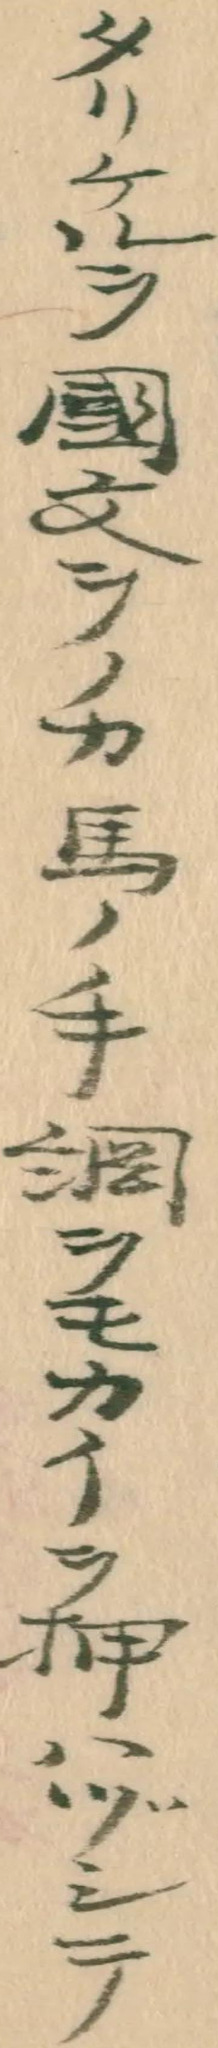タリケルヲ国文ヲノカ馬ノ手綱ヲモカイヲ押ハヅシテ
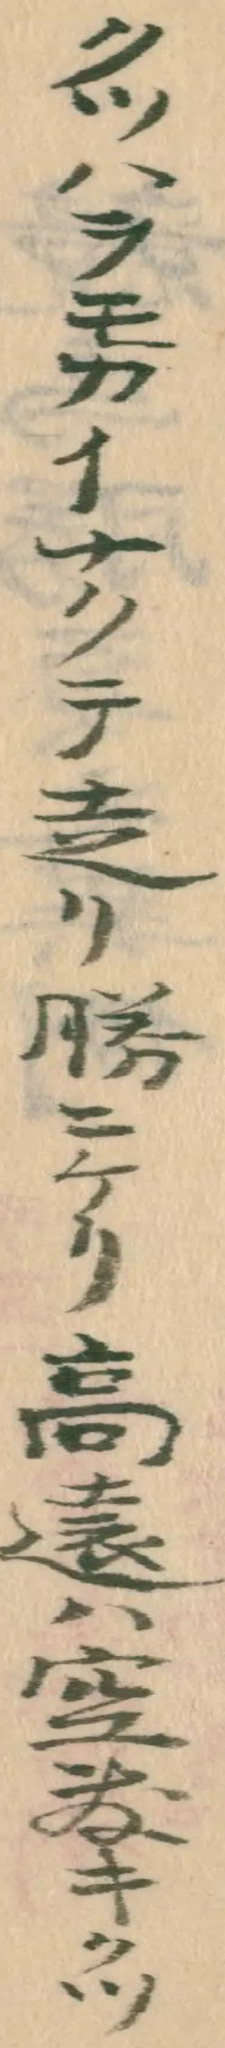クツハヲモカイナクテ走リ勝ニケリ高遠ハ空敷キクツ
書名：賀茂社記録. 第12冊
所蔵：国立国会図書館 National Diet Library, JAPAN
